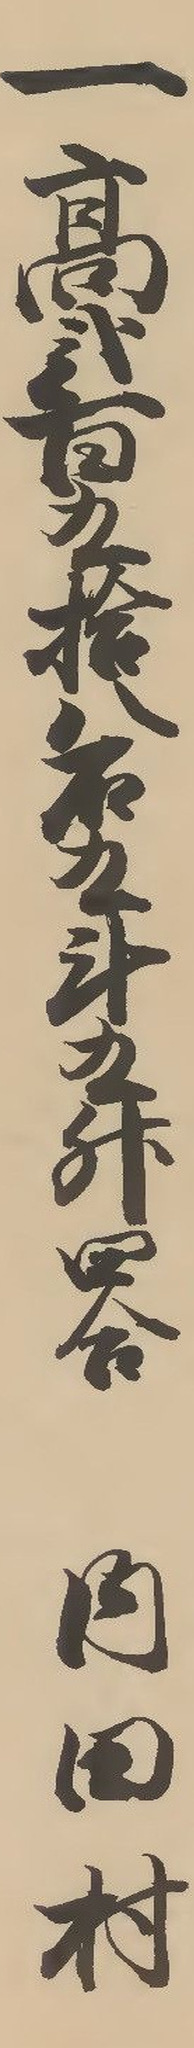一髙弐百九拾八石九斗九升四合内田村
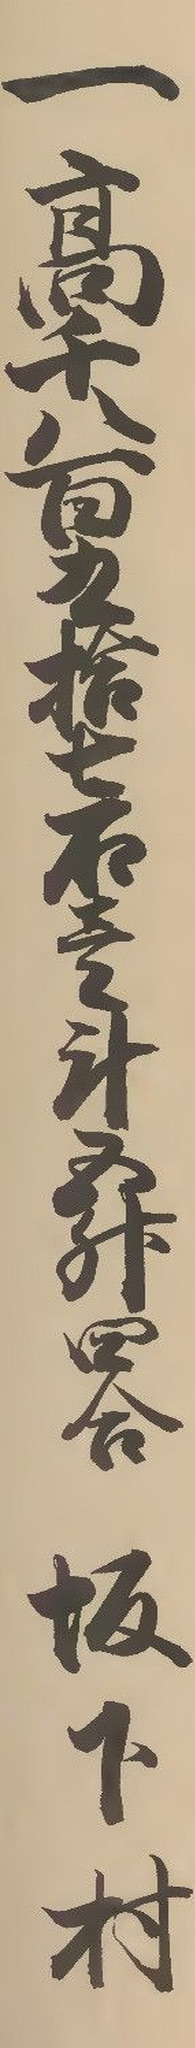一髙千八百九拾七石壱斗五升四合坂下村
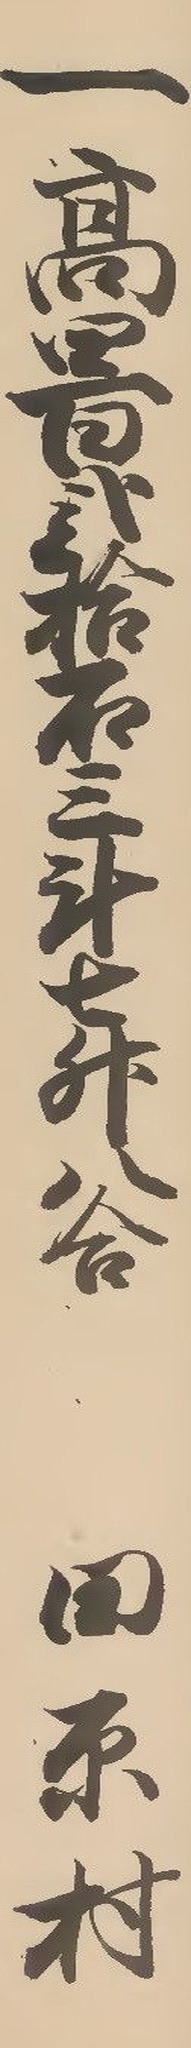一髙四百弐拾石三斗七升八合田原村
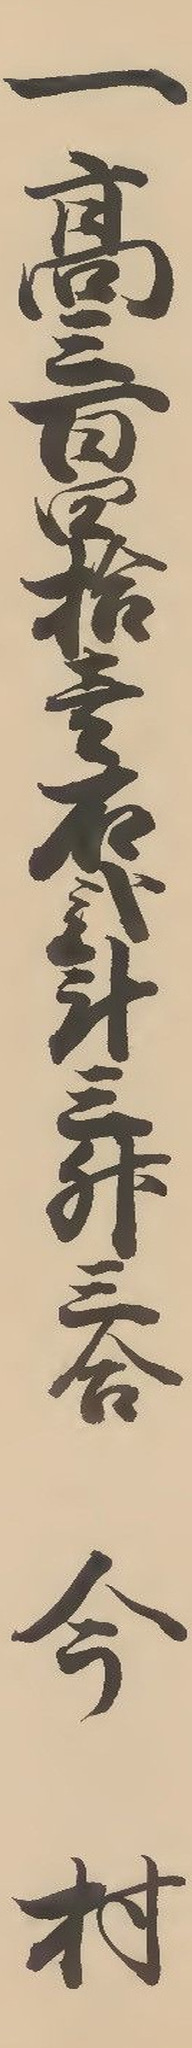一髙三百四拾壱石弐斗三升三合今村
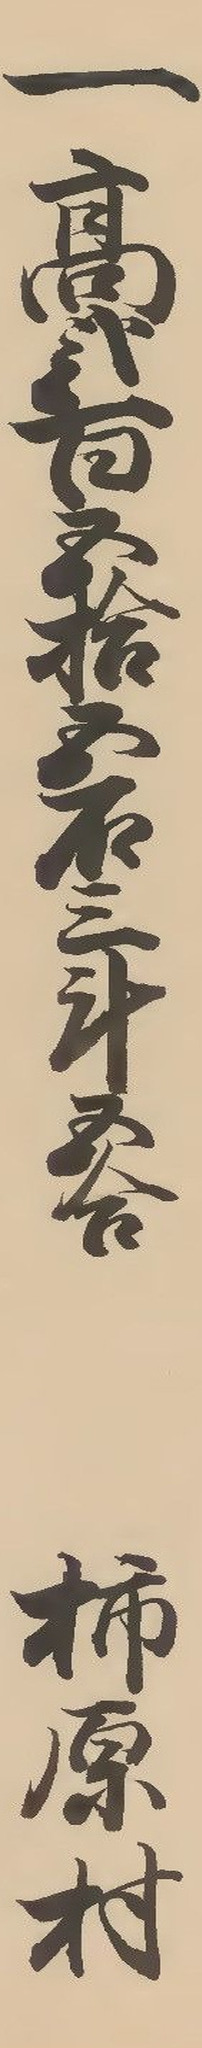一髙弐百五拾五石三斗五合柿原村
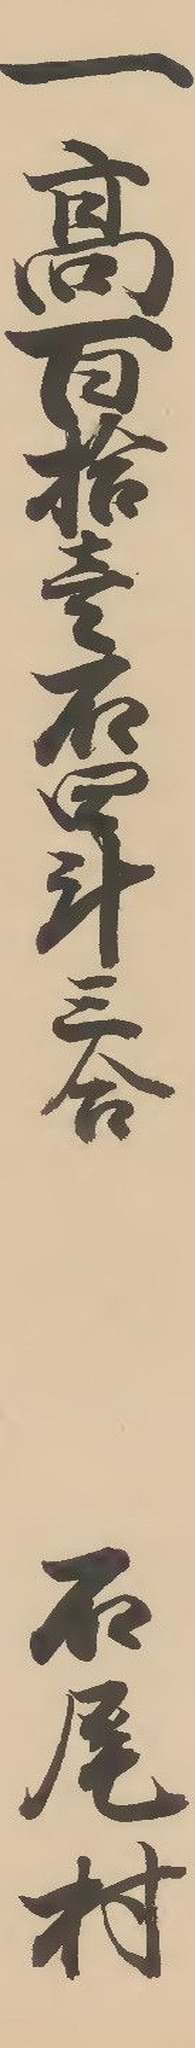一髙百拾壱石四斗三合石尾村

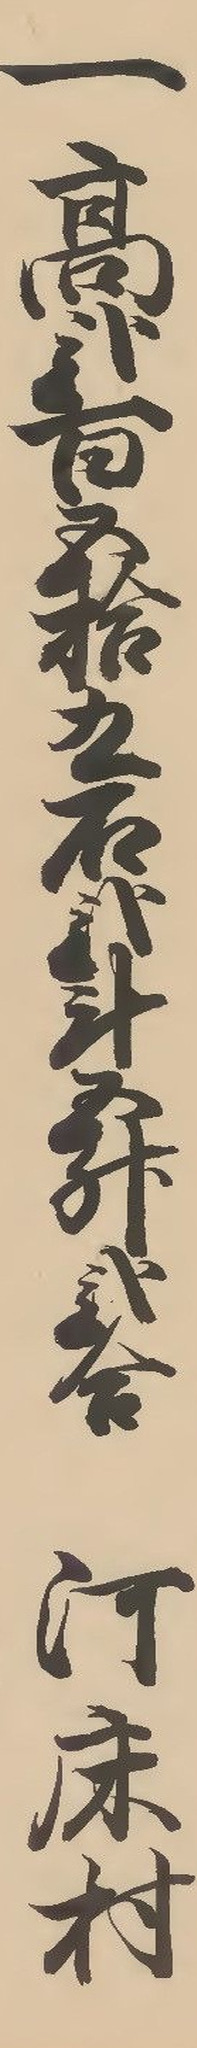一髙弐百五拾九石弐斗五升弐合河床村
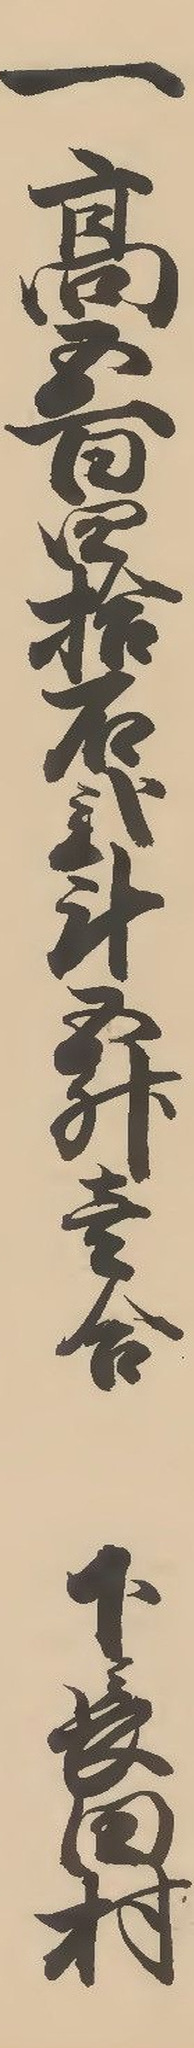一髙五百四拾石弐斗五升壱合下長田村
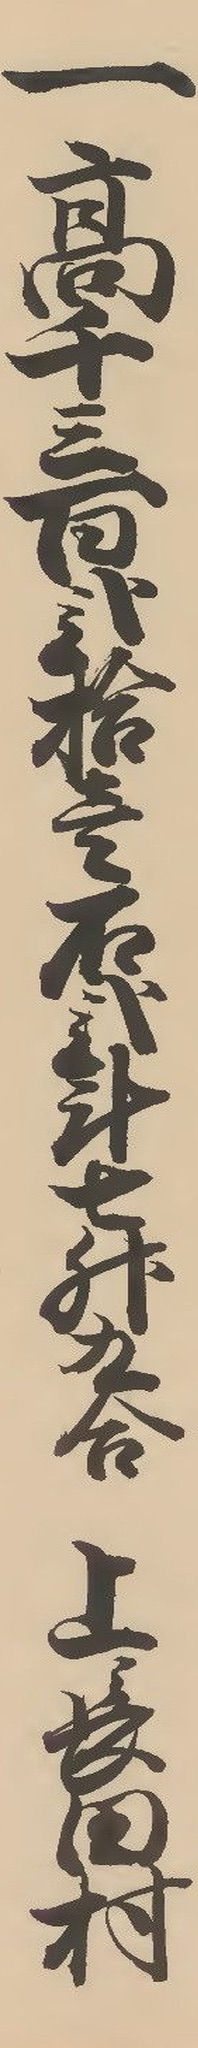一髙千三百弐拾壱石弐斗七升九合上長田村
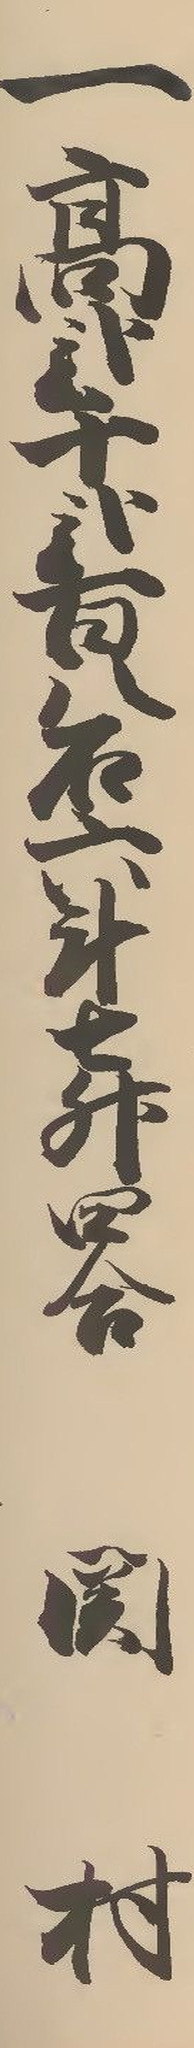一髙弐千弐百八石六斗七升四合関村
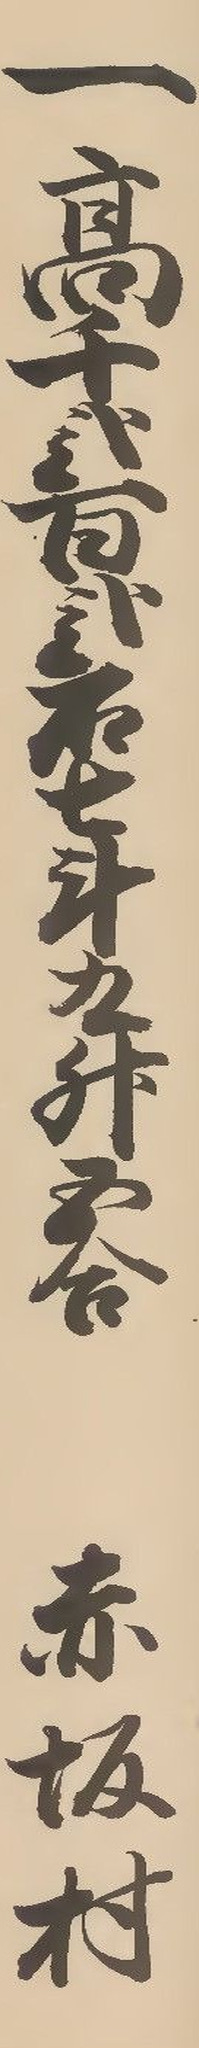一髙千弐百弐石七斗九升五合赤坂村
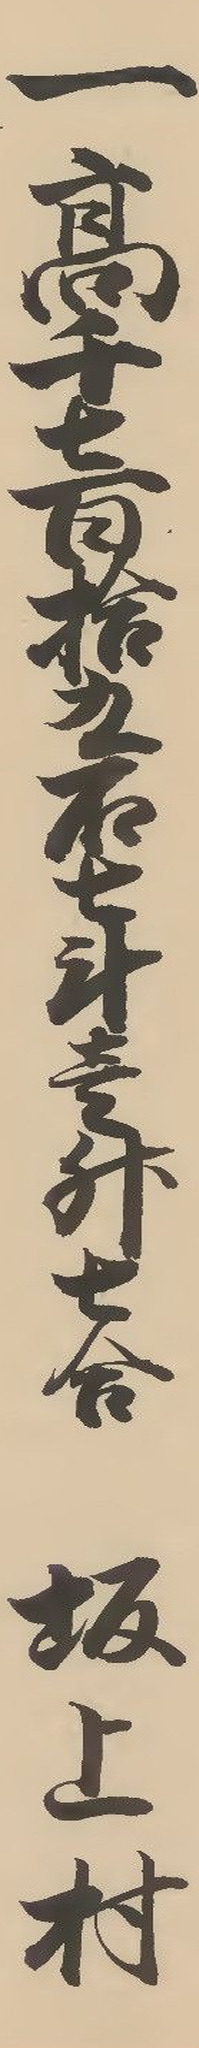一髙千七百拾九石七斗壱升七合坂上村
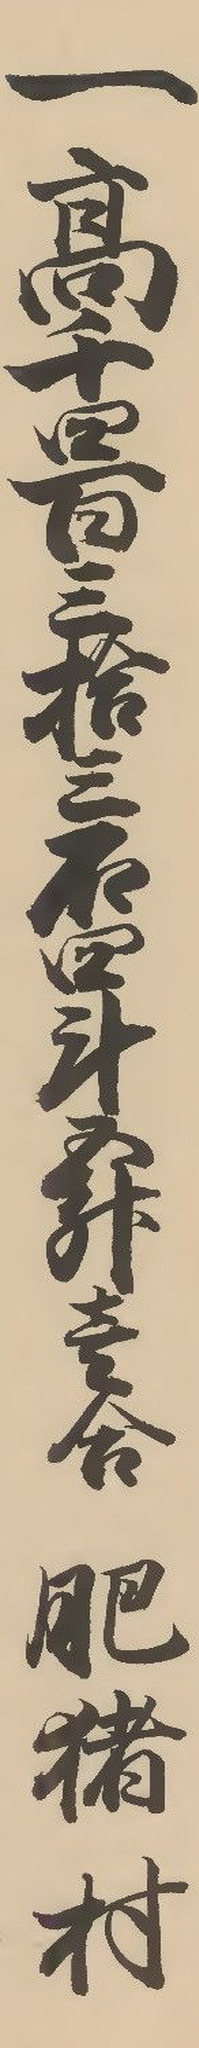一髙千四百三拾三石四斗五升壱合肥猪村
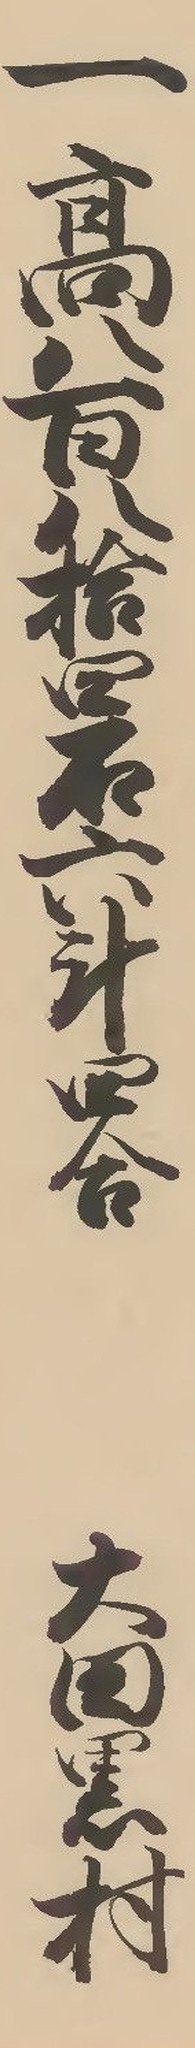一髙八百八拾四石六斗四合大田黑村

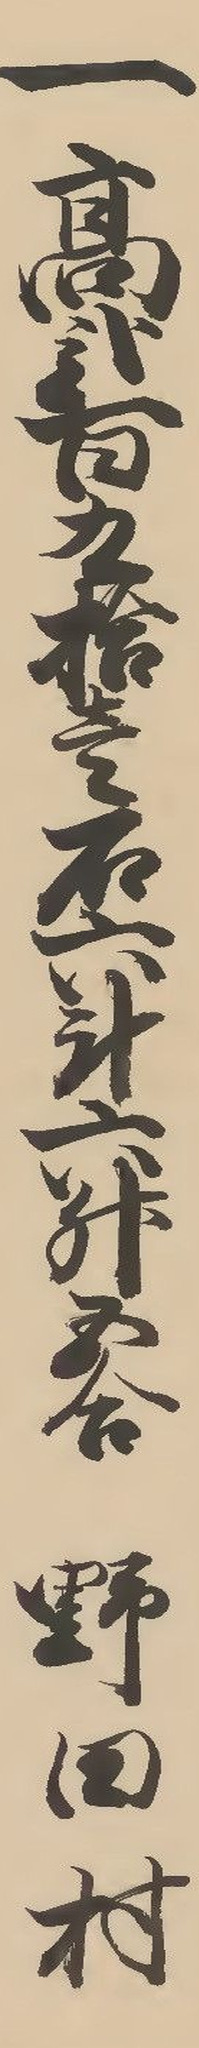一髙弐百九拾壱石六斗六升五合野田村
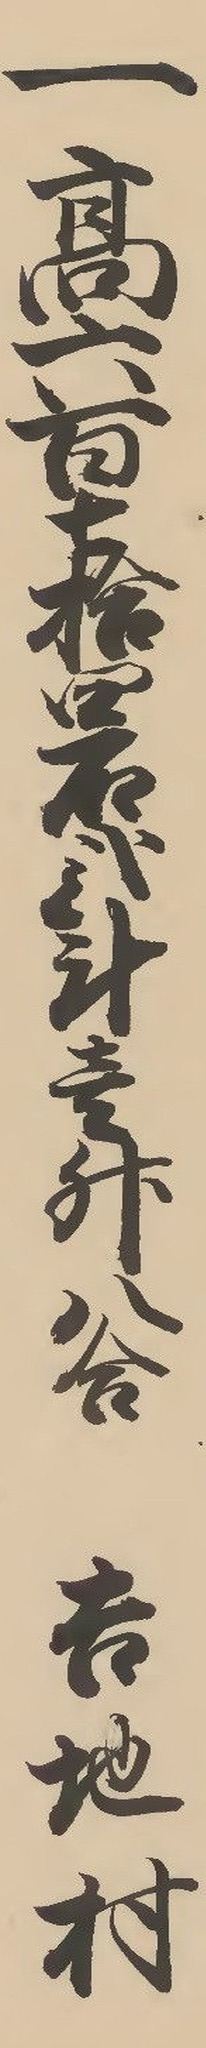一髙六百七拾四石弐斗壱升八合吉地村
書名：肥後国郷帳
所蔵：国立公文書館 National Archives of Japan
